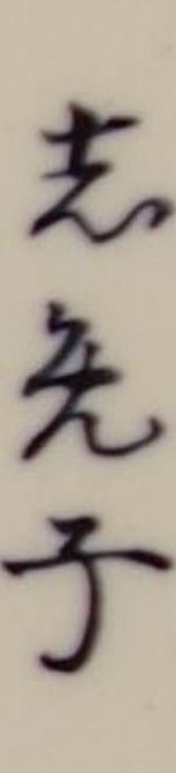しめ子
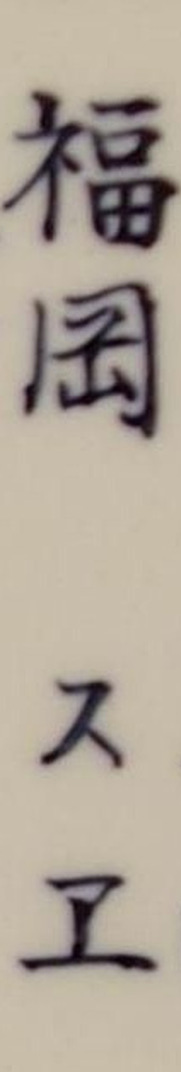福岡スヱ
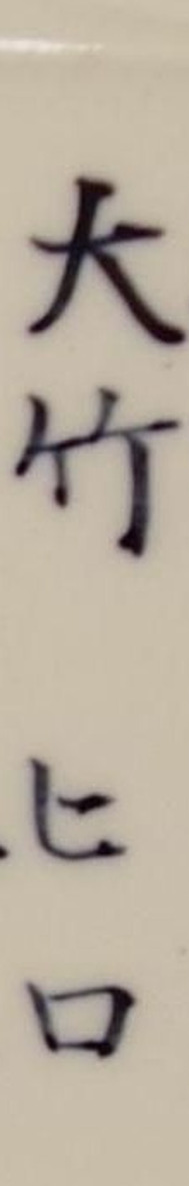大竹ヒ口
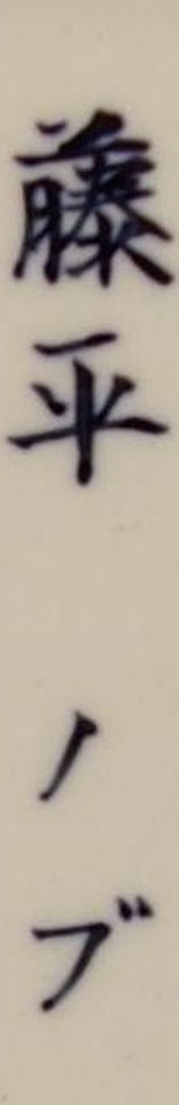藤平ノブ
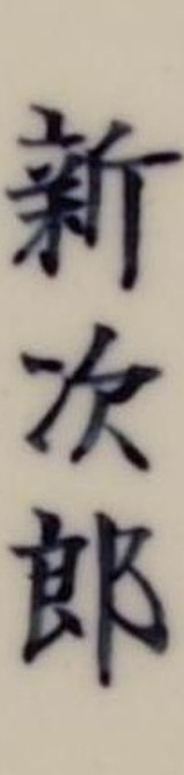新次郎
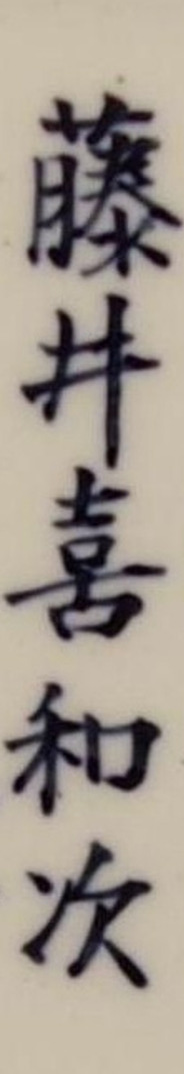藤井喜和次
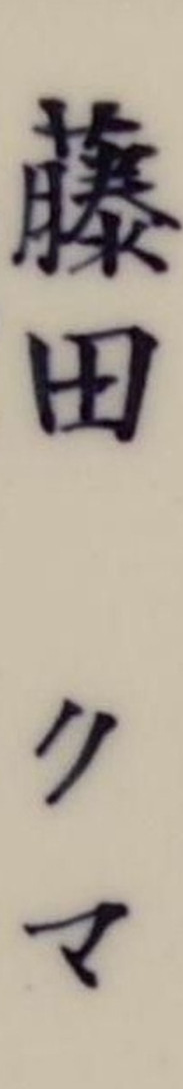藤田クマ
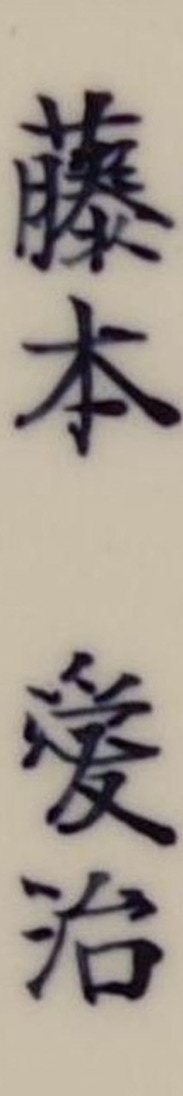藤本愛治
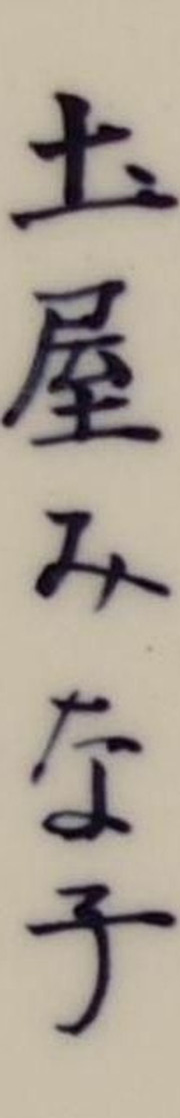土屋みな子
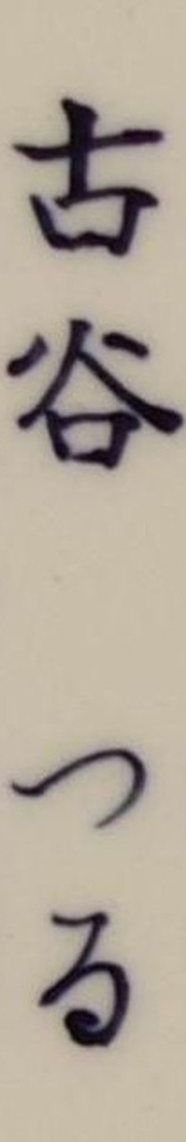古谷つる
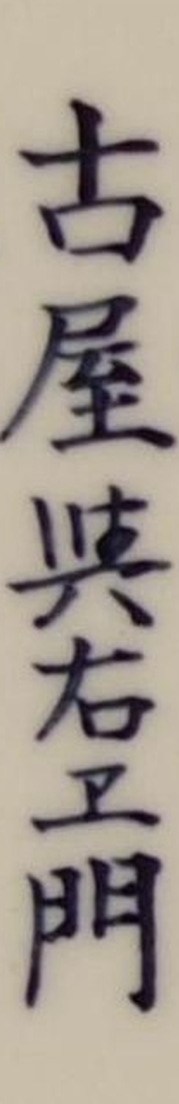古屋与右ヱ門
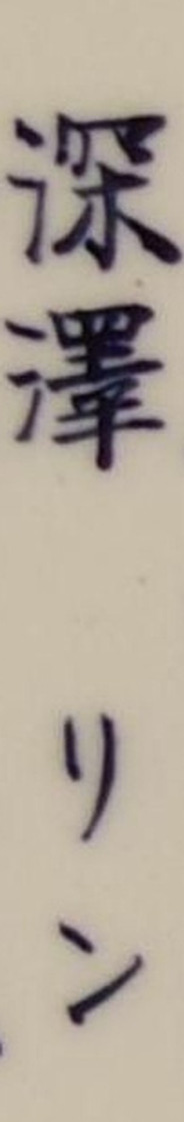深澤リン
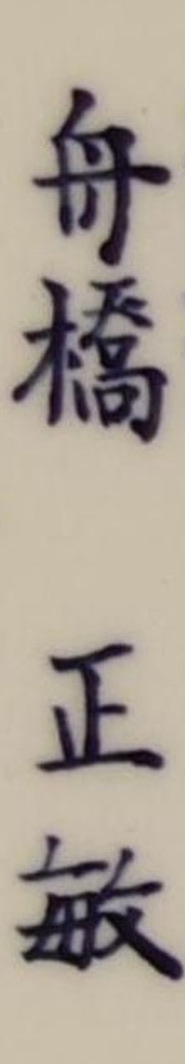舟橋正敏
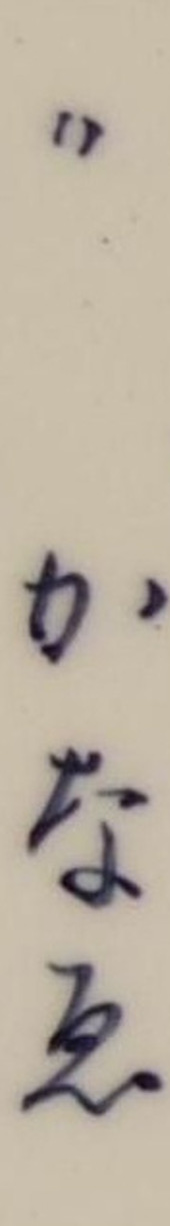かなゑ
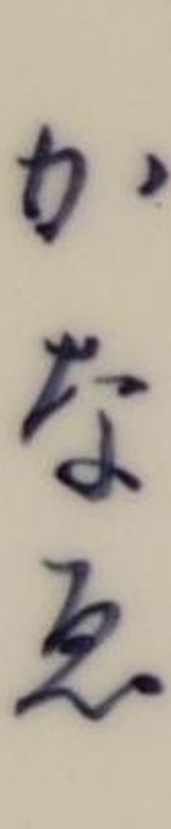かなゑ
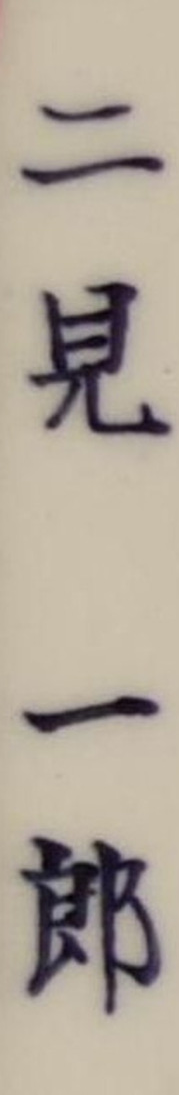二見一郎
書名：M~S
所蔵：高野山金剛峯寺
